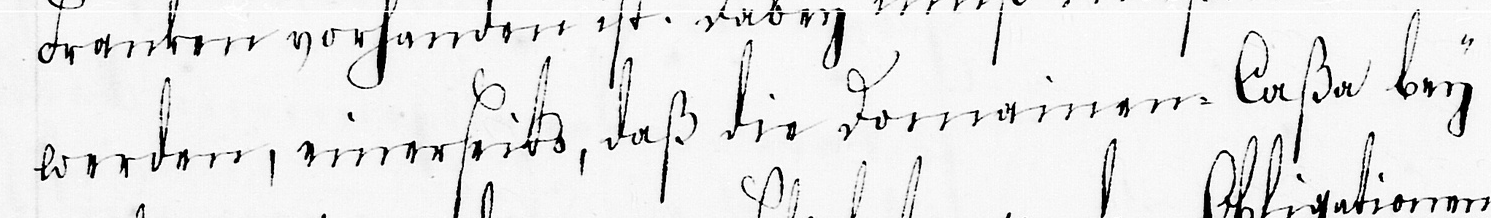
werden, einerseits, daß die Domainen-Caßa bey
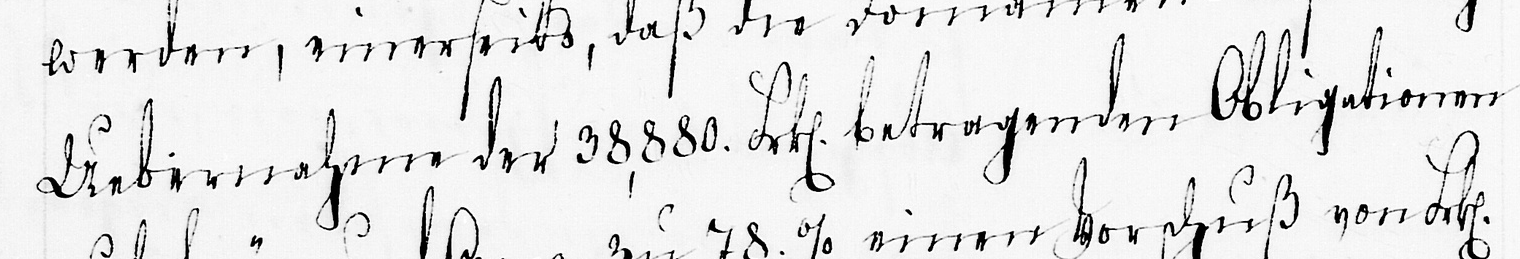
Uebernahme der 38,880. Frk[en]. betragenden Obligationen
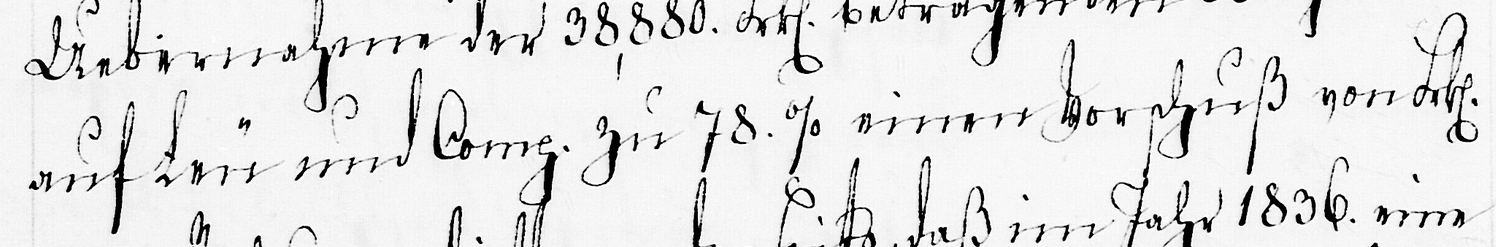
auf Leu und Comp. zu 78. %. einen Vorschuß von Frk[e¬
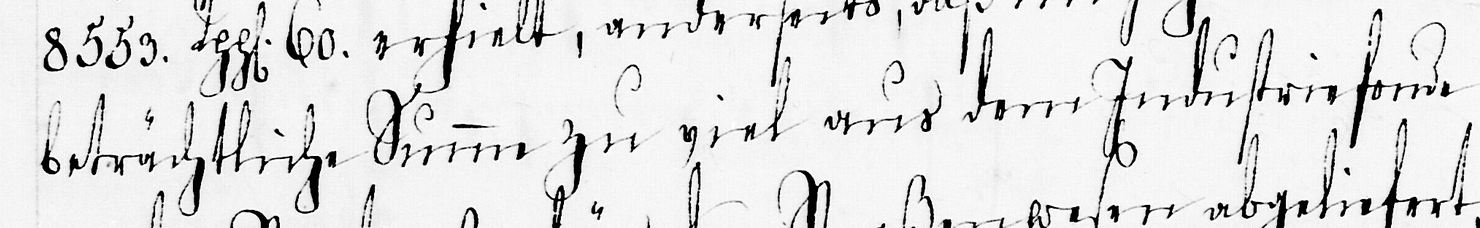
beträchtliche Summe zu viel aus dem Industriefonde
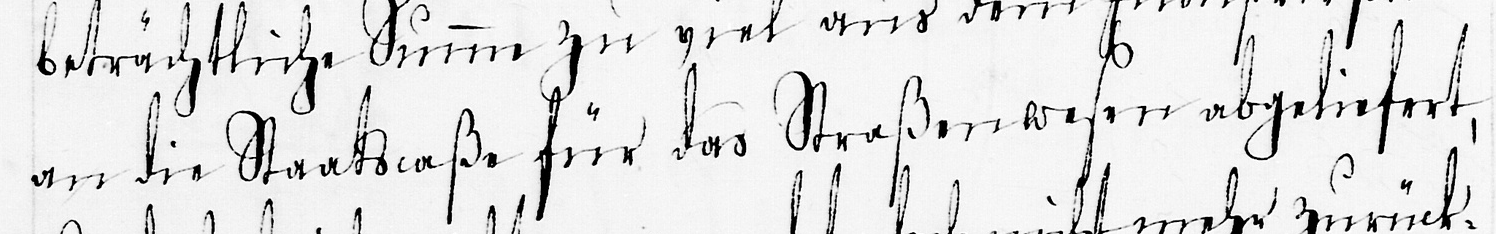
an die Staatscaße für das Straßenwesen abgeliefert,
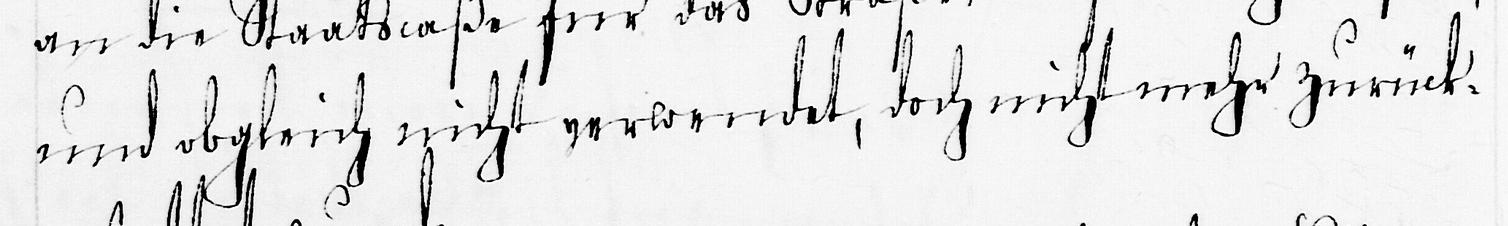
und obgleich nicht verwendet, doch nicht mehr zurück¬
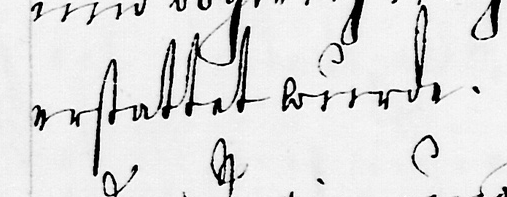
erstattet wurde.
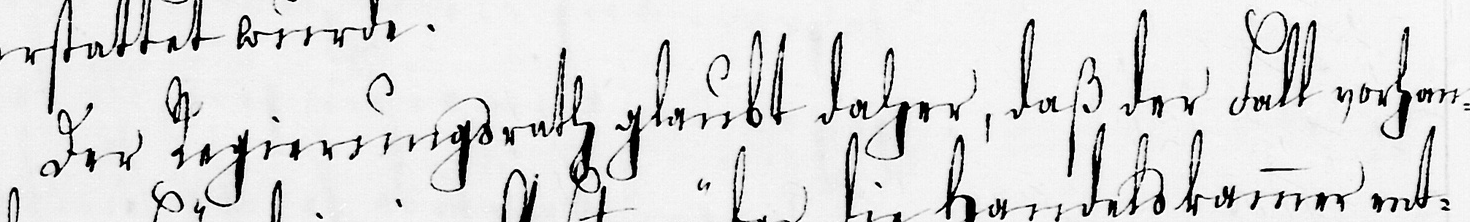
Der Regierungsrath glaubt daher, daß der Fall vor¬
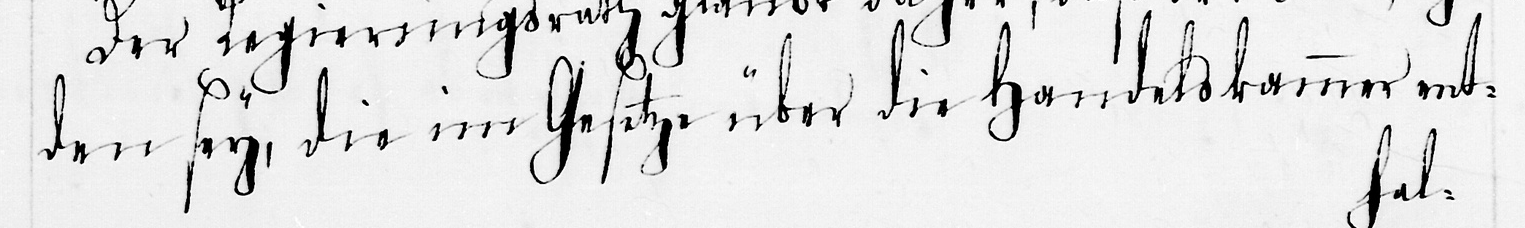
den sey, die im Gesetze über die Handelskammer ent-
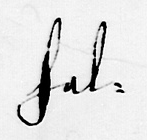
han¬
